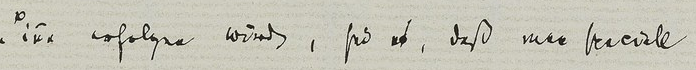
Sinne erfolgen würde, sei es, daß man speciell
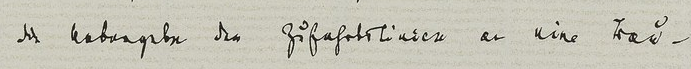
die Uebergabe der Zufahrtslinien an eine Bau-
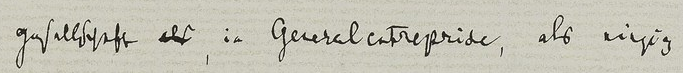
gesellschaft als in Generalentreprise, als einzig
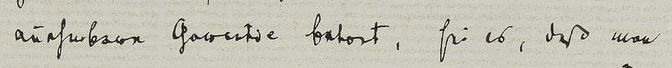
annehmbare Garantie betont, sei es, daß man
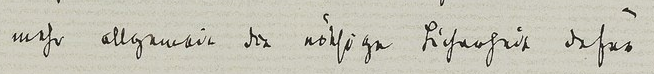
mehr allgemein die nöthige Sicherheit dafür
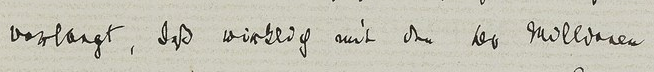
verlangt, daß wirklich mit den 40 Millionen
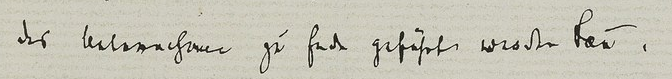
das Unternehmen zu Ende geführt werden kann.»
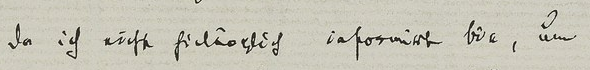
Da ich nicht hinlänglich informirt bin, um
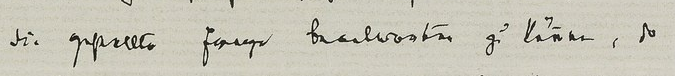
die gestellte Frage beantworten zu können, so
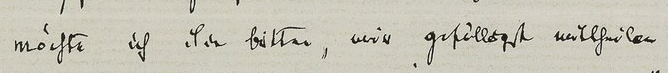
möchte ich Sie bitten, mir gefälligst mittheilen
